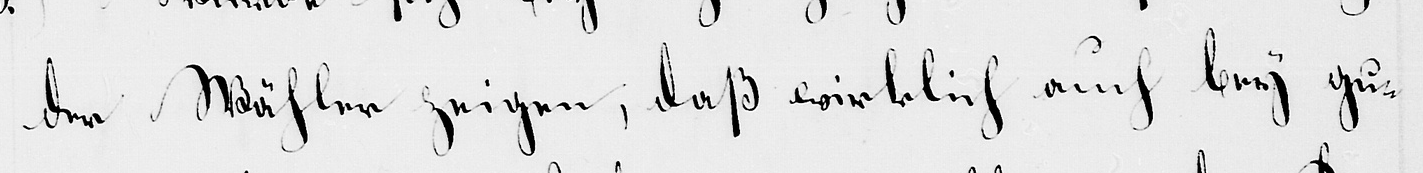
der Wähler zeigen, daß wirklich auch bey gu¬
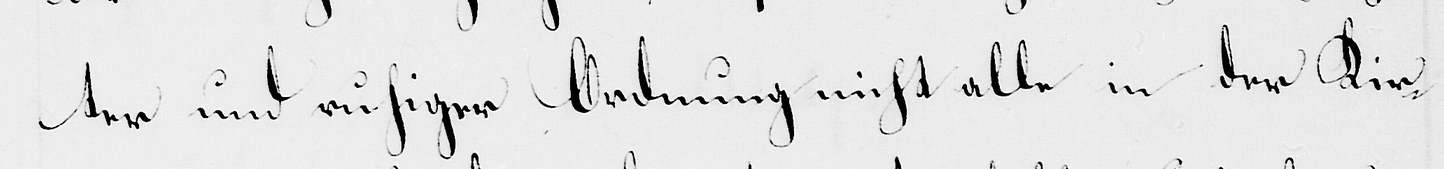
ter und ruhiger Ordnung nicht alle in der Kir¬
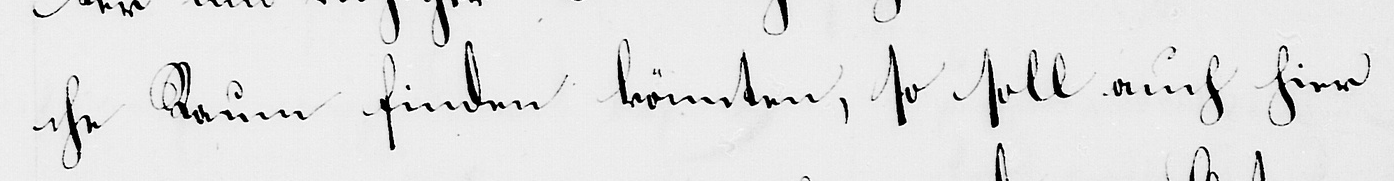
che Raum finden könnten, so soll auch hier
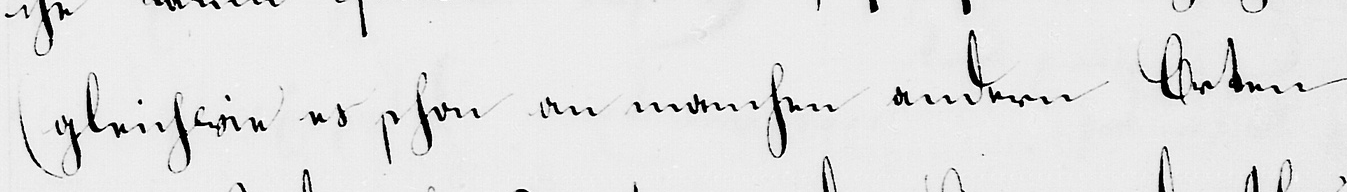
(gleichwie es schon an manchen andern Orten
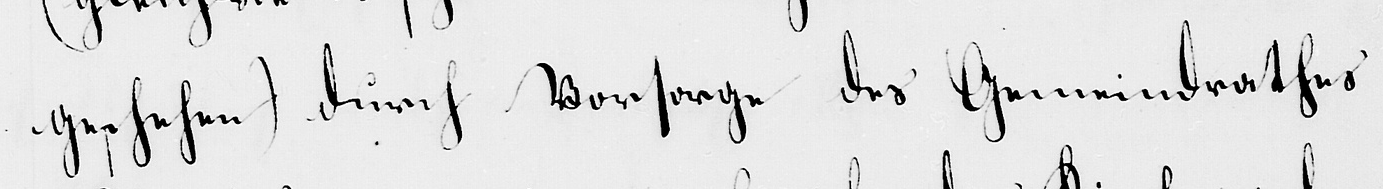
geschehen) durch Vorsorge des Gemeindrathes
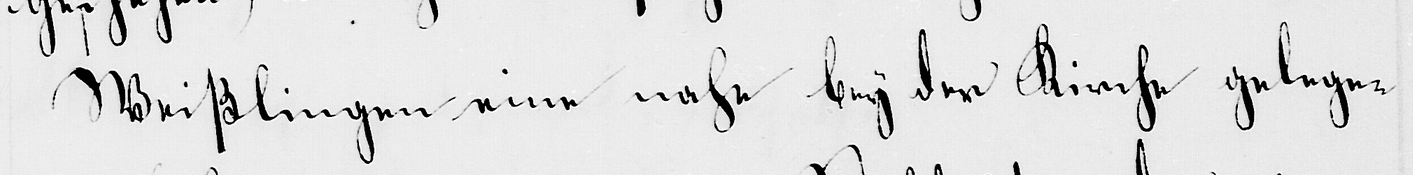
Weißlingen eine nahe bey der Kirche gelege¬
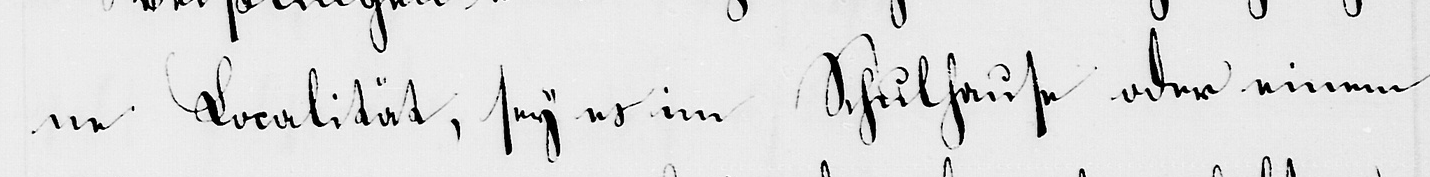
ne Localität, sey es im Schulhause oder einem
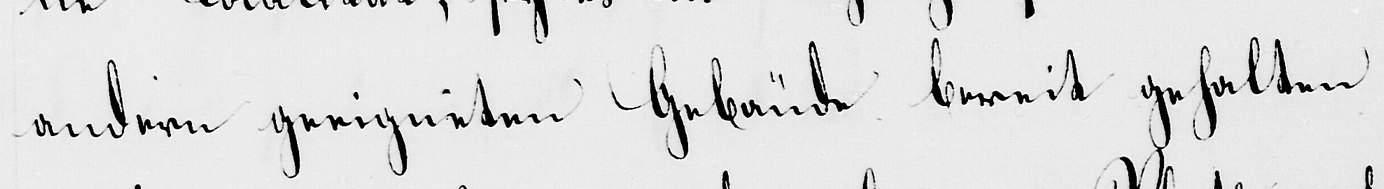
andern geeigneten Gebäude bereit gehalten
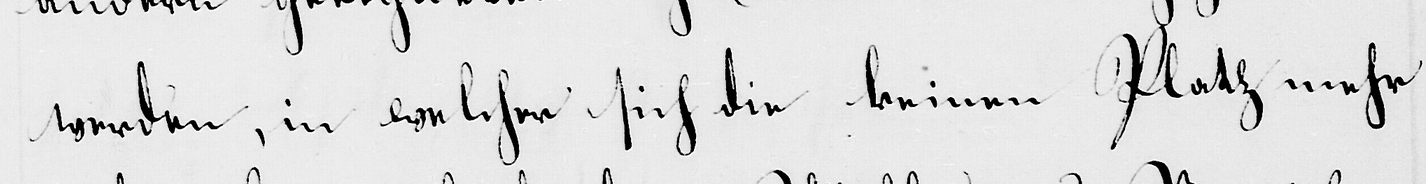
werden, in welcher sich die keinen Platz mehr
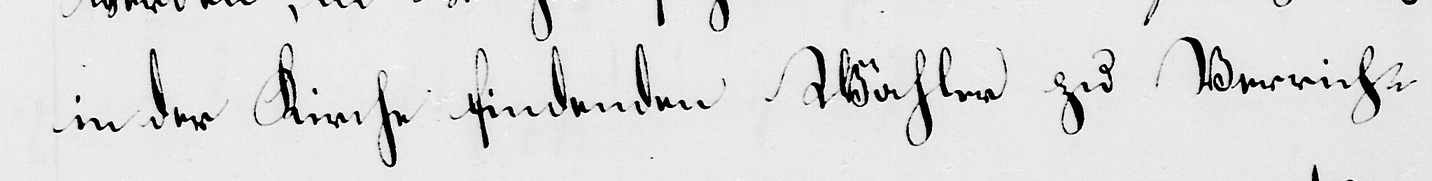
in der Kirche findenden Wähler zu Verrich-
